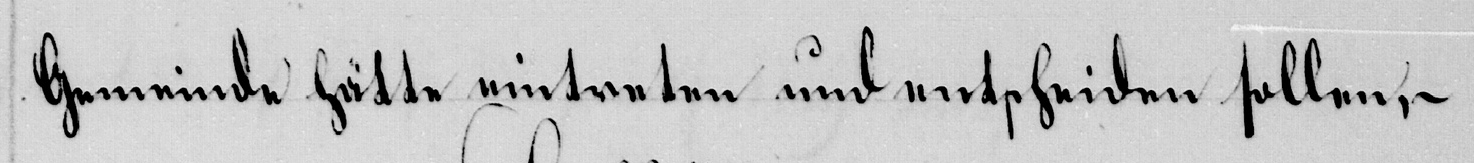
Gemeinde hätte eintreten und entscheiden sollen, –
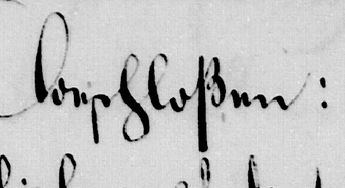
beschloßen:
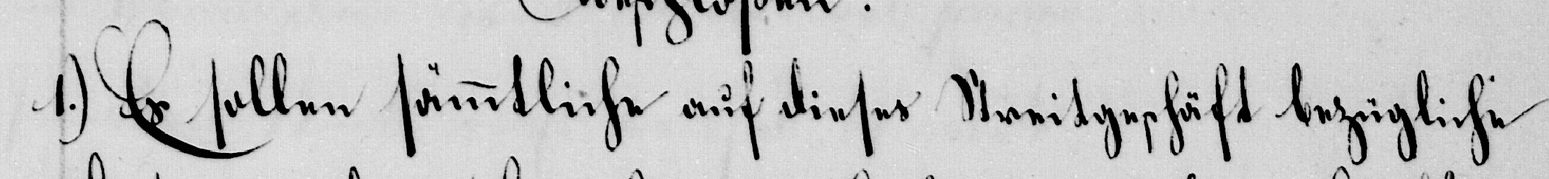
1.) Es sollen sämmtliche auf dieses Streitgeschäft bezügliche
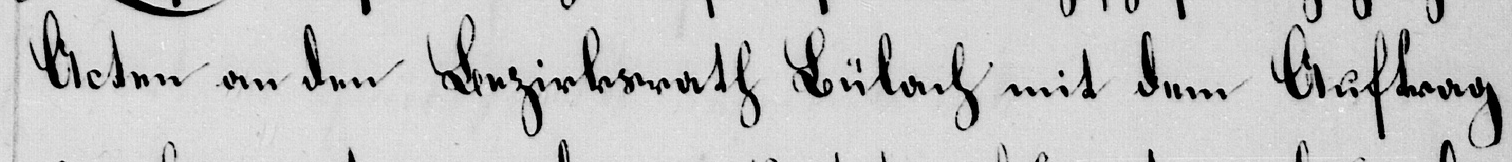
Acten an den Bezirksrath Bülach mit dem Auftrag
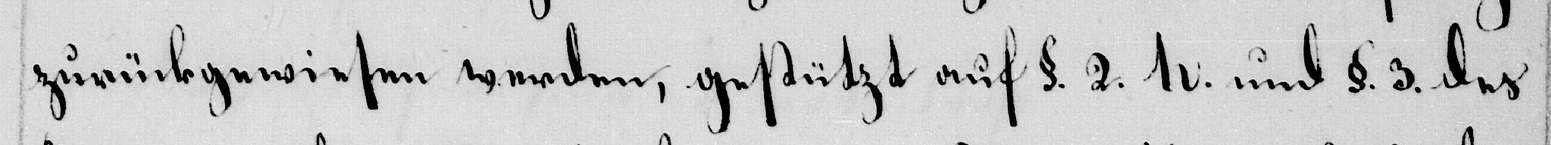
zurückgewiesen werden, gestützt auf §. 2. h. und §. 3. des
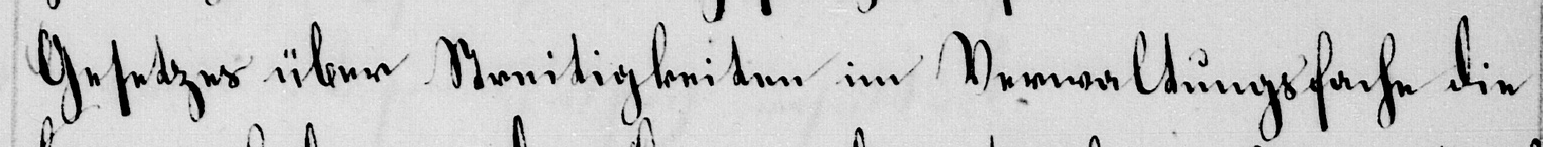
Gesetzes über Streitigkeiten im Verwaltungsfache die
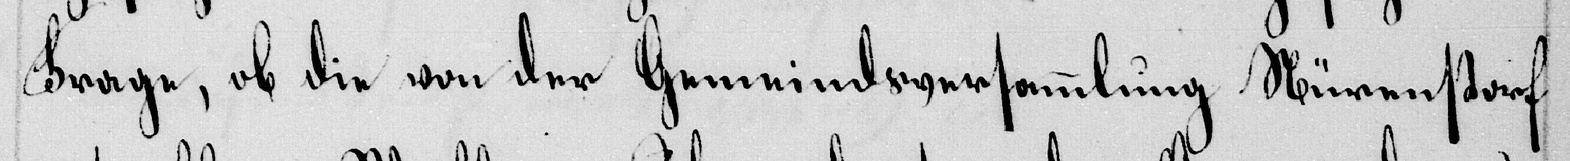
Frage, ob die von der Gemeindsversammlung Nürenstorf
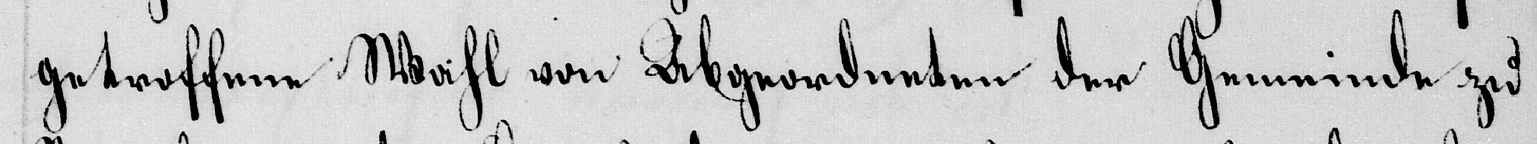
getroffene Wahl von Abgeordneten der Gemeinde zu
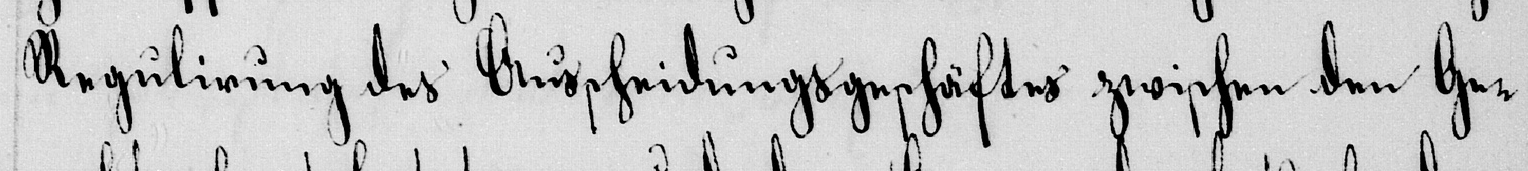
Regulirung des Ausscheidungsgeschäftes zwischen den Ge¬
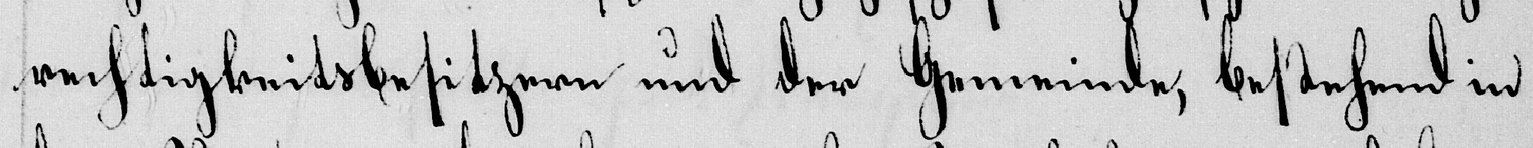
rechtigkeitsbesitzern und der Gemeinde, bestehend in
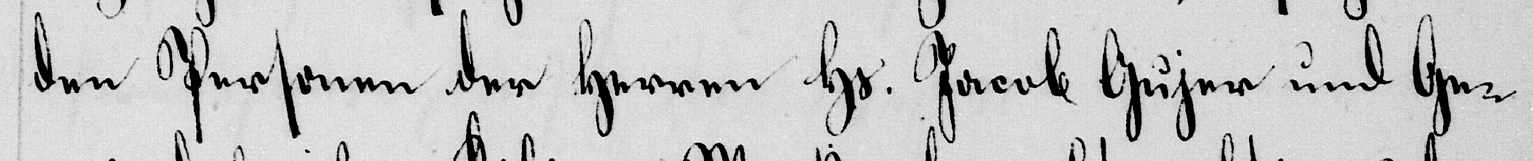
den Personen der Herren Hs. Jacob Gujer und Ge¬
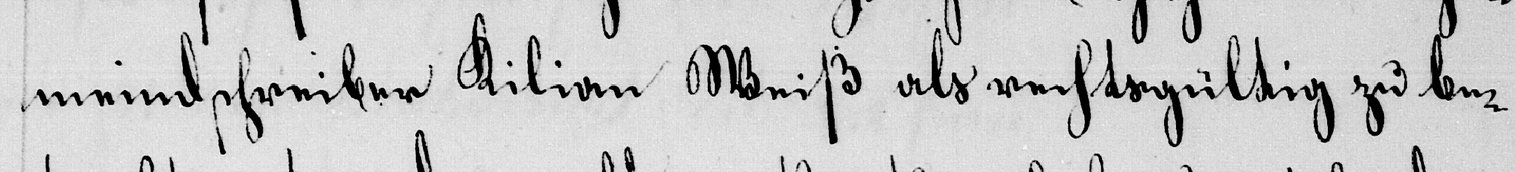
meindschreiber Kilian Weiß als rechtsgültig zu be¬
